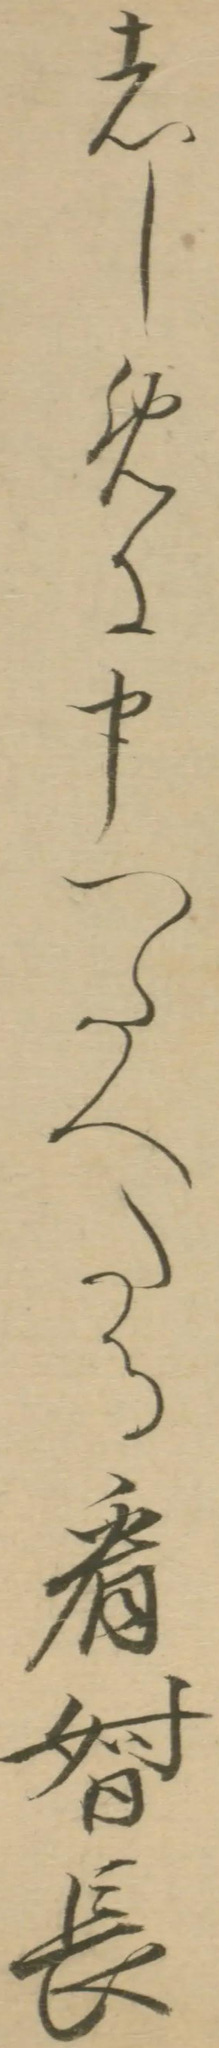はしめに申つたへたる看督長
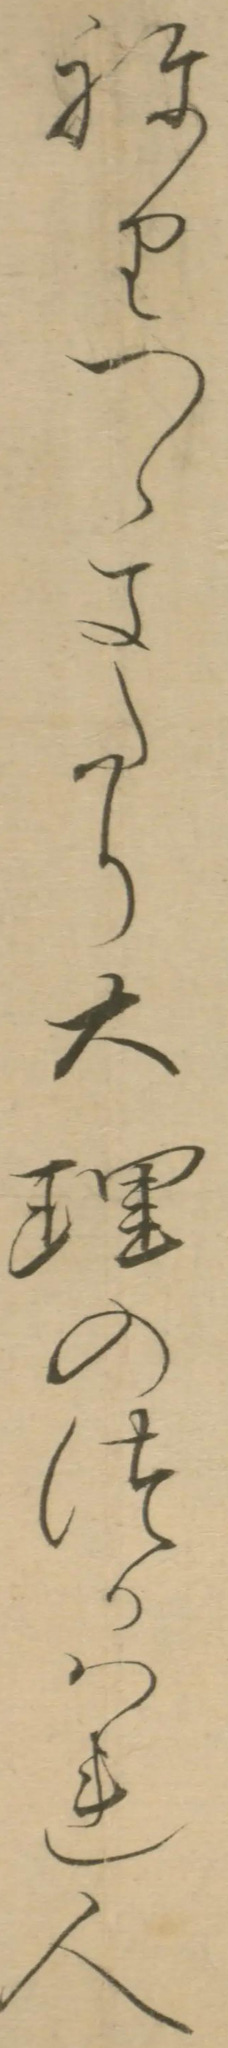ねりつゝきたり大理のつかはれ人
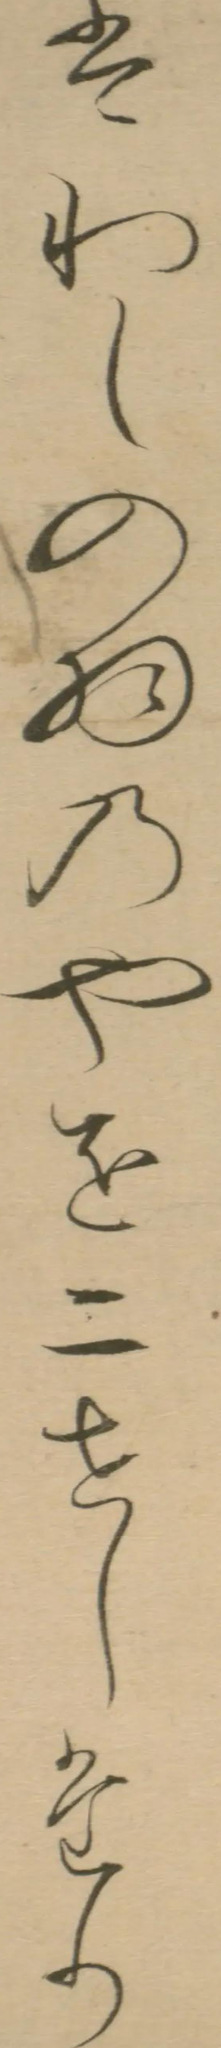はわしの羽のやを二さしたり
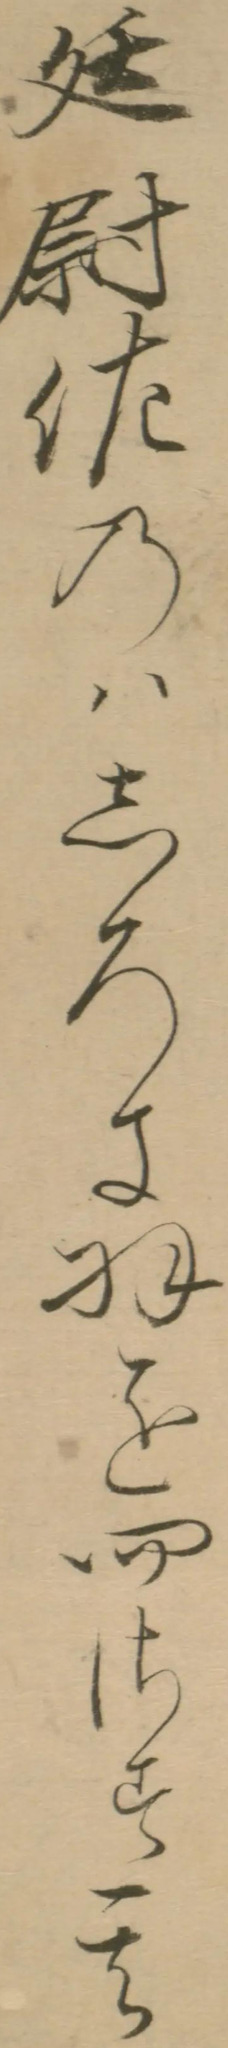廷尉佐のはしろき羽を四さす其
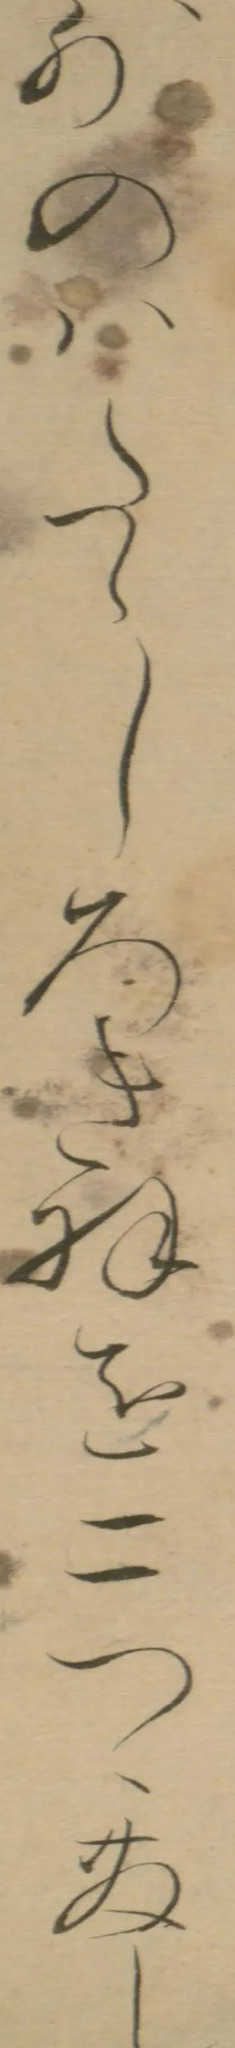外のはたゝしろき羽を二つゝさし

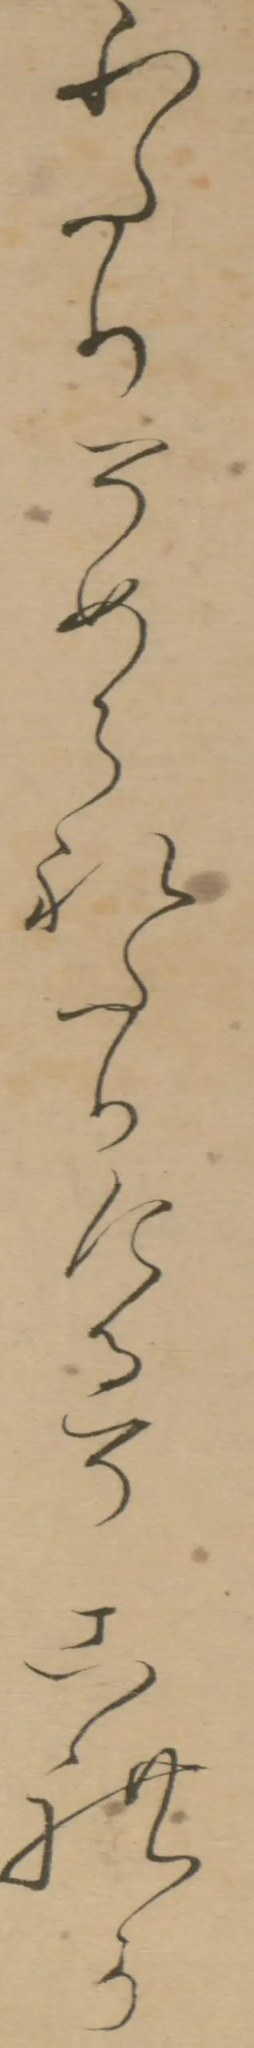わたりそめられたりけるそこれか
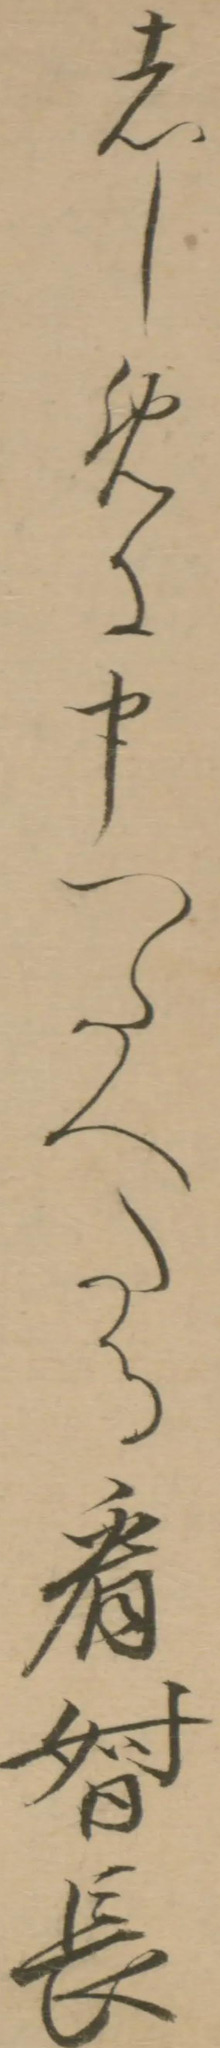はしめに申つたへたる看督長
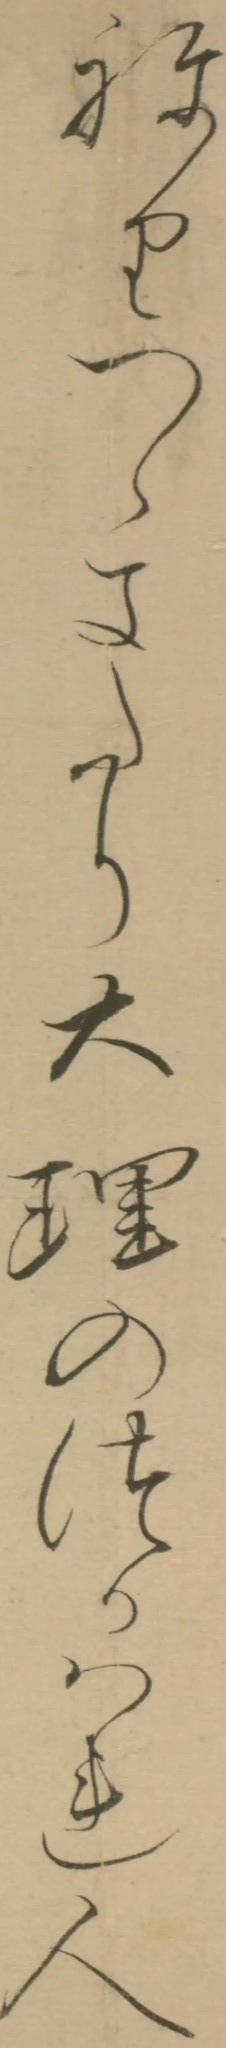ねりつゝきたり大理のつかはれ人
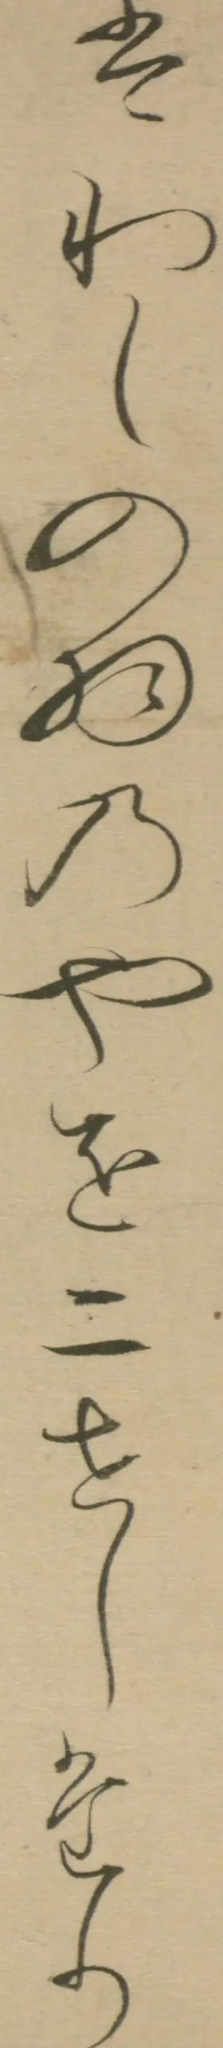はわしの羽のやを二さしたり
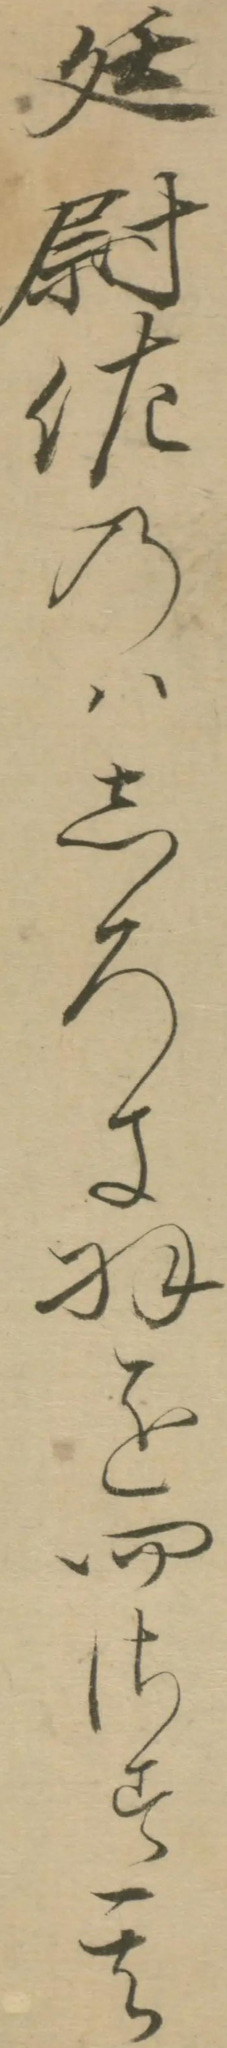廷尉佐のはしろき羽を四さす其
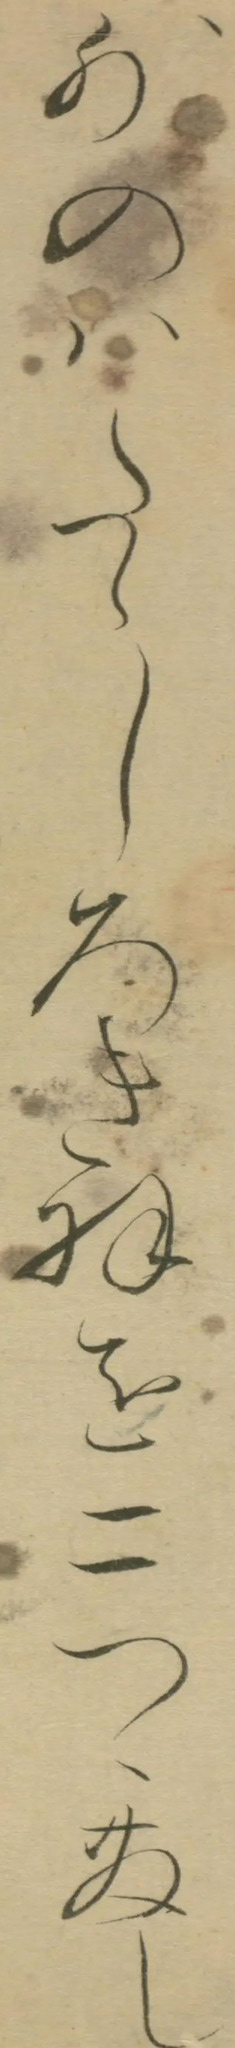外のはたゝしろき羽を二つゝさし
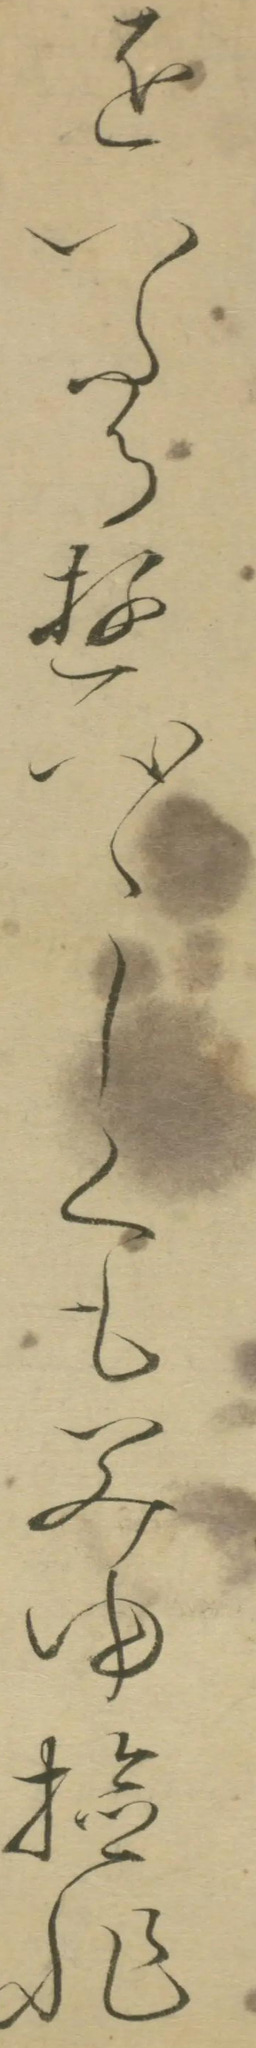をいたるゆへ〳〵しくもみゆ撿非
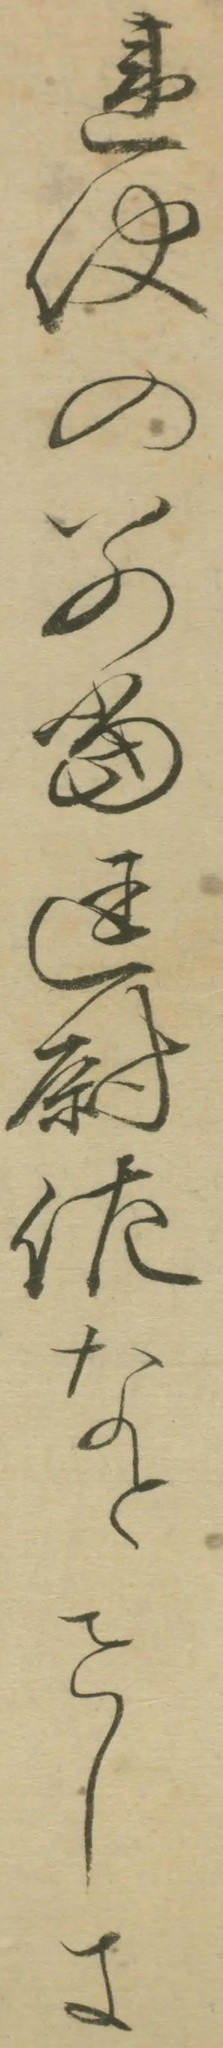違使の別当廷尉佐なとさしき
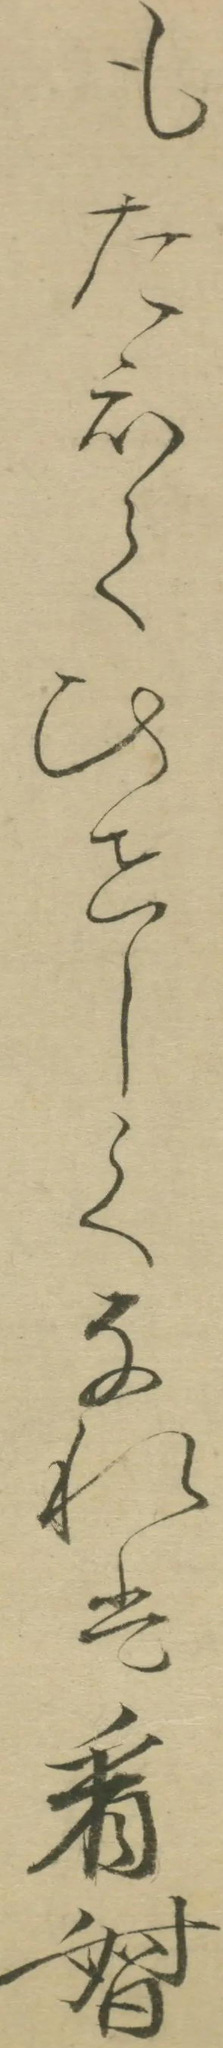もたえてひさしくなれは看督
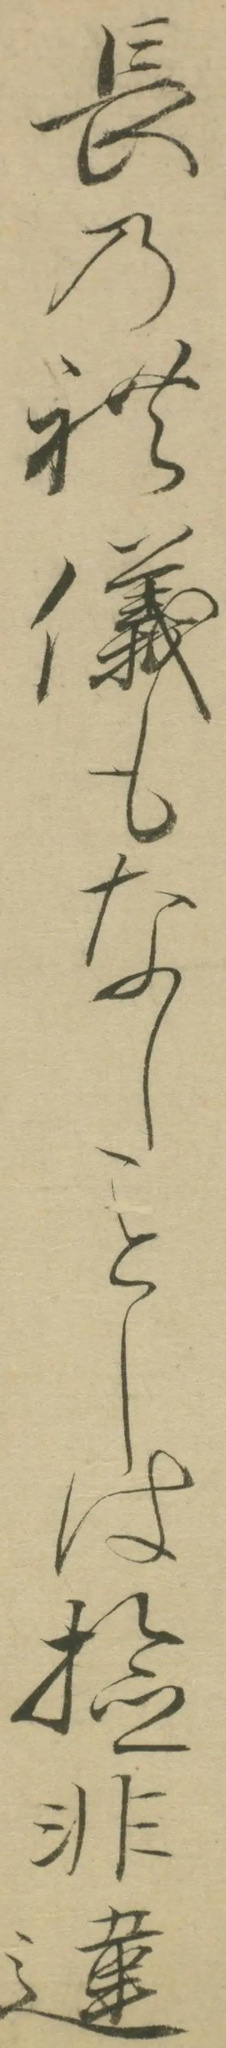長の礼儀もなしことしは撿非違
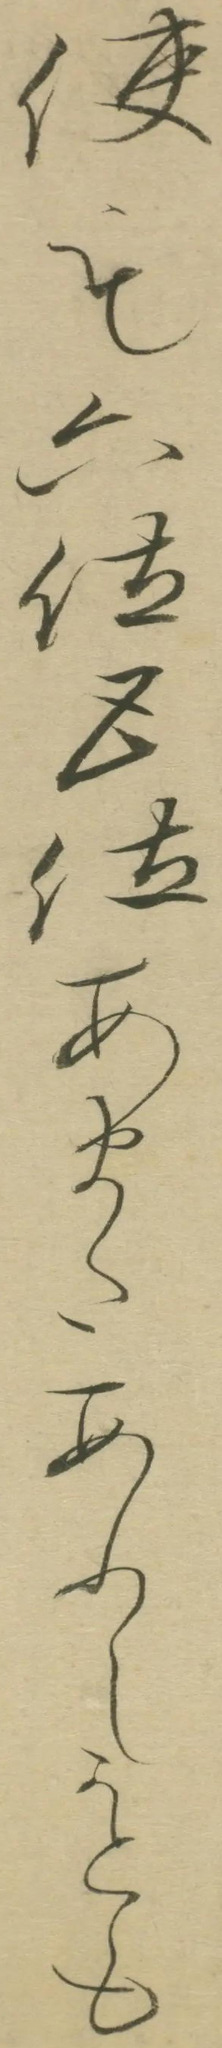使も六位五位あまたありしかとも
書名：文永賀茂祭図. [1]
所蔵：国立国会図書館 National Diet Library, JAPAN
